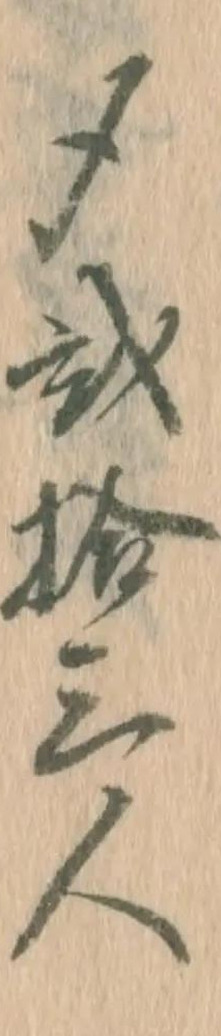〆弐拾三人
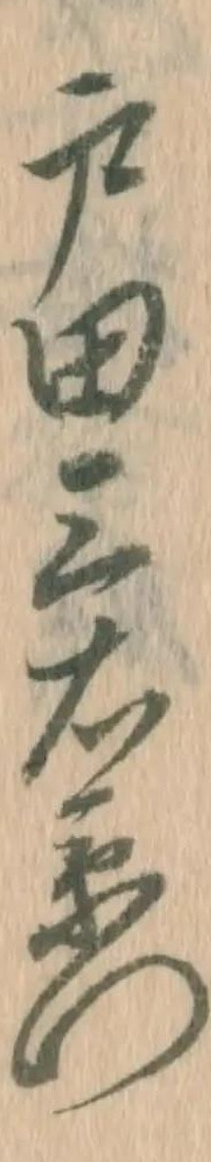戸田三右衛門
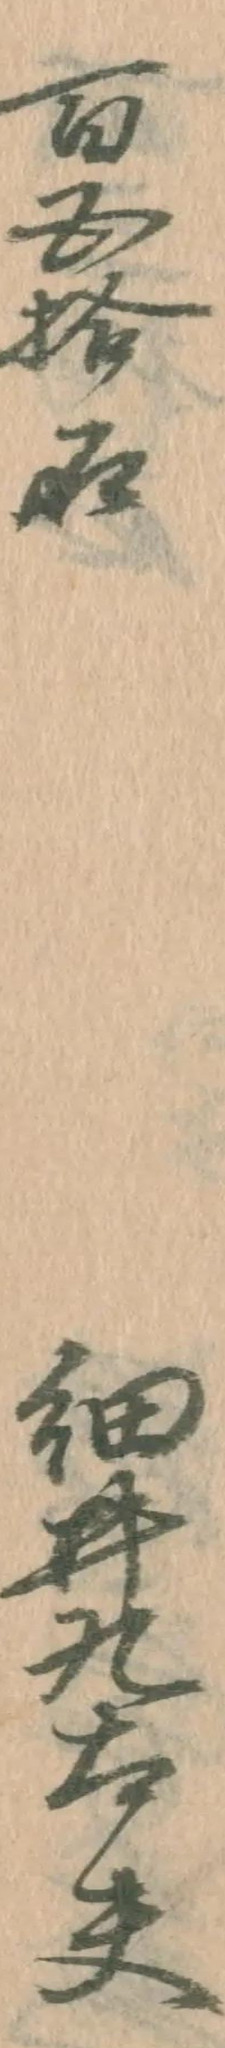百五拾石細井九太夫
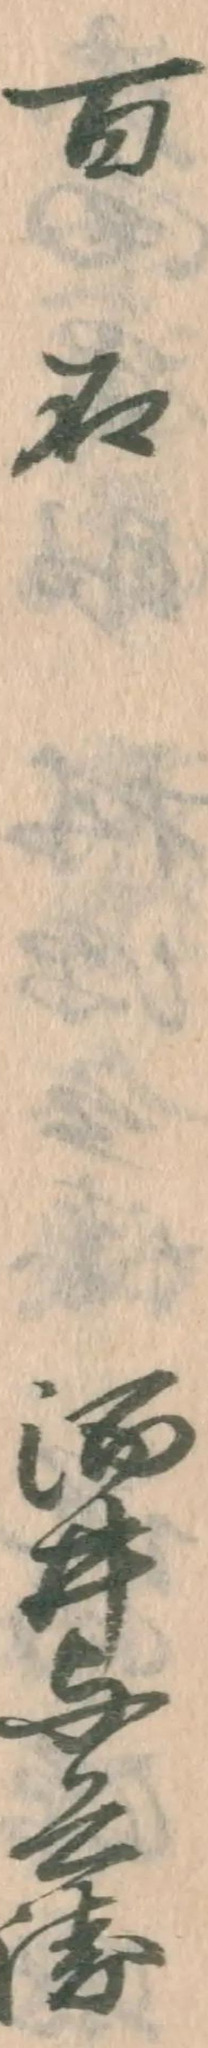百石酒井与兵衛
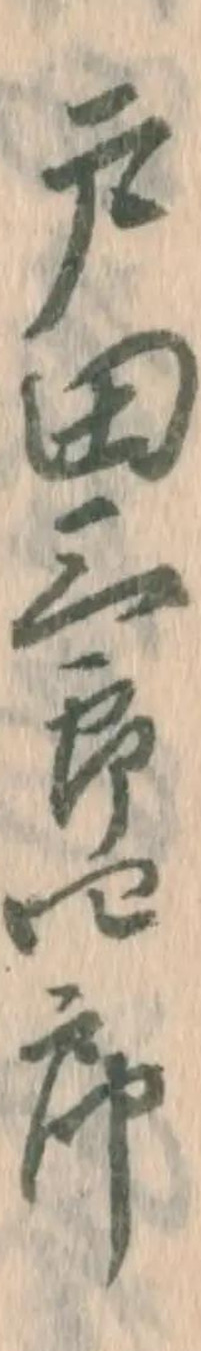戸田三郎四郎
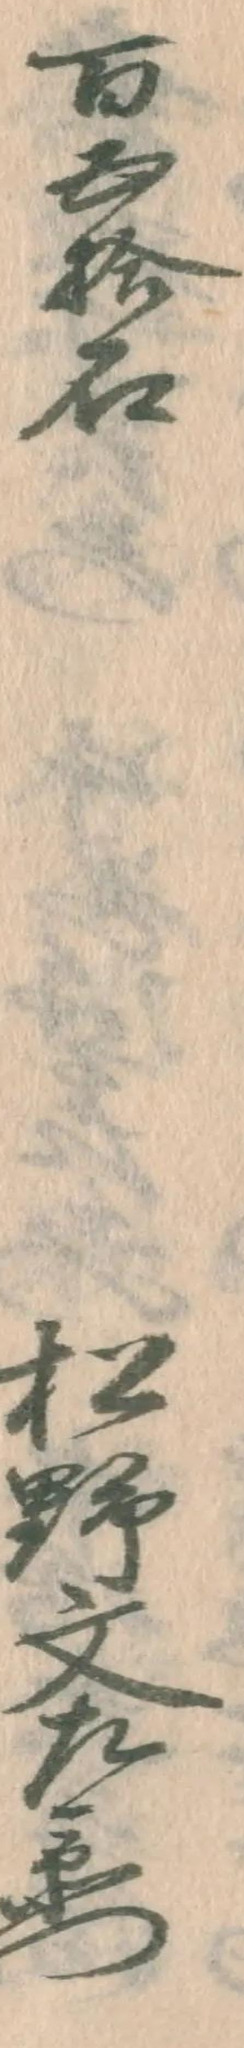百五拾石松野文左衛門
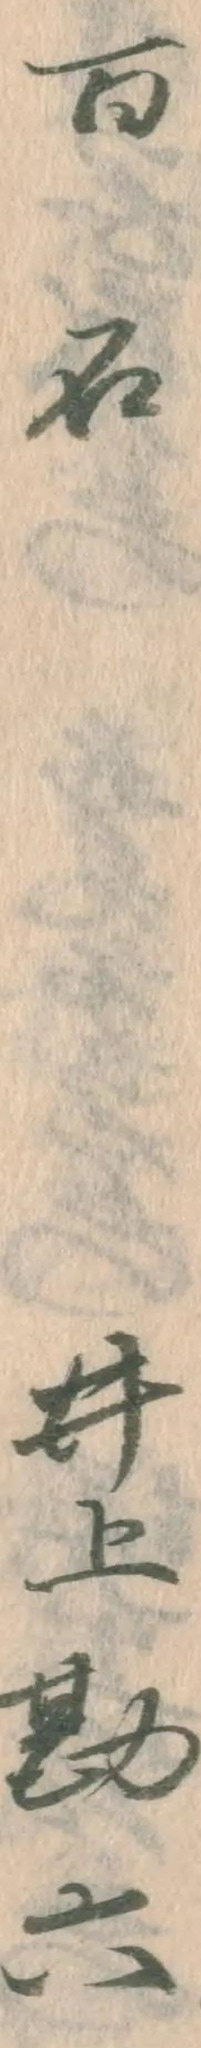百石井上勘六
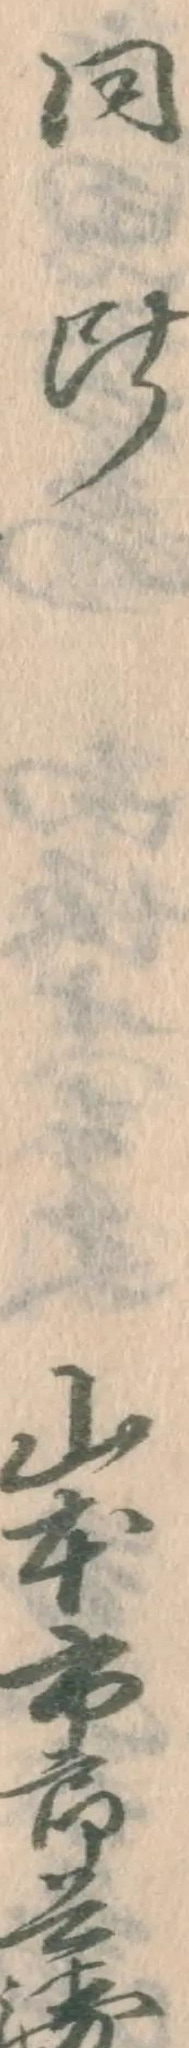同断山本市郎兵衛
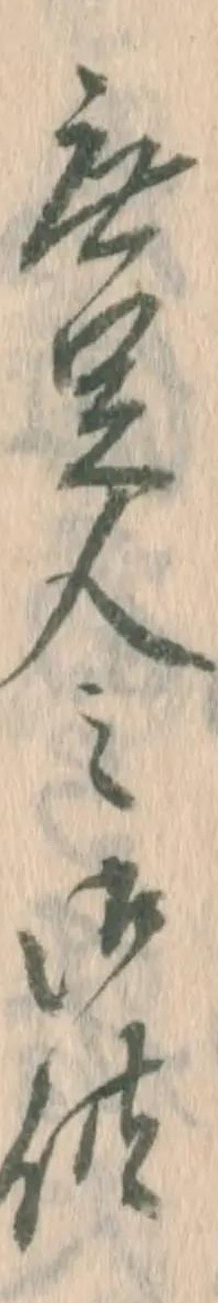無足人之御供
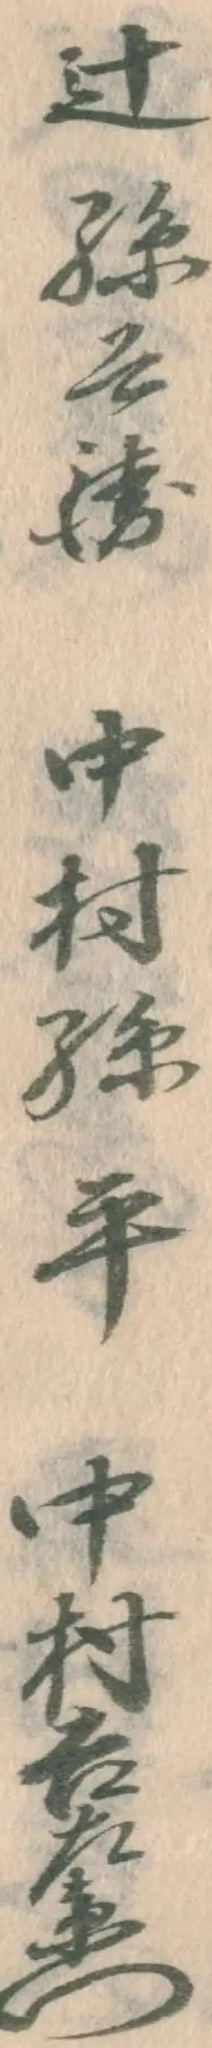辻孫兵衛中村孫平中村吉左衛門
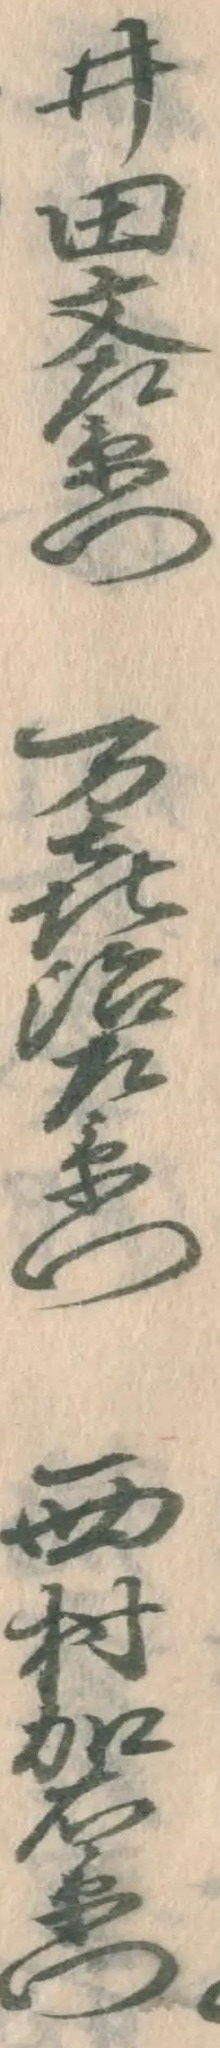井田文左衛門万喜治左衛門西村加右衛門
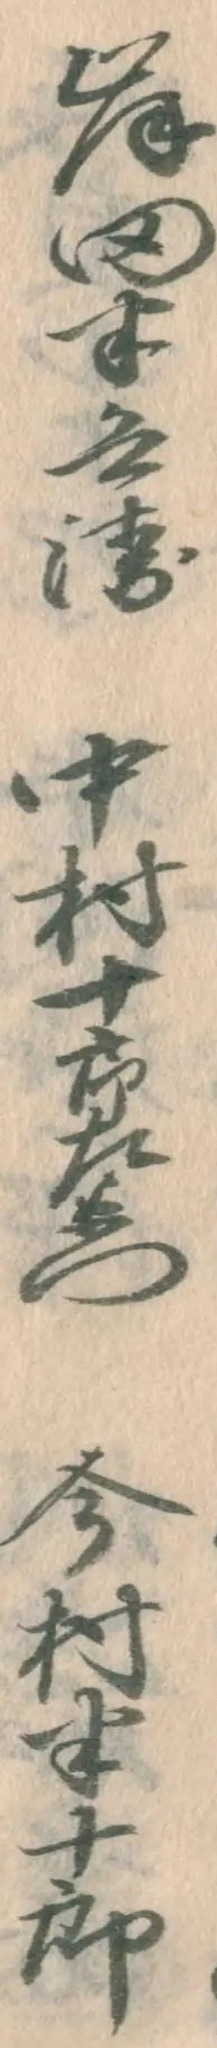岸田半兵衛中村十郎左衛門今村半十郎
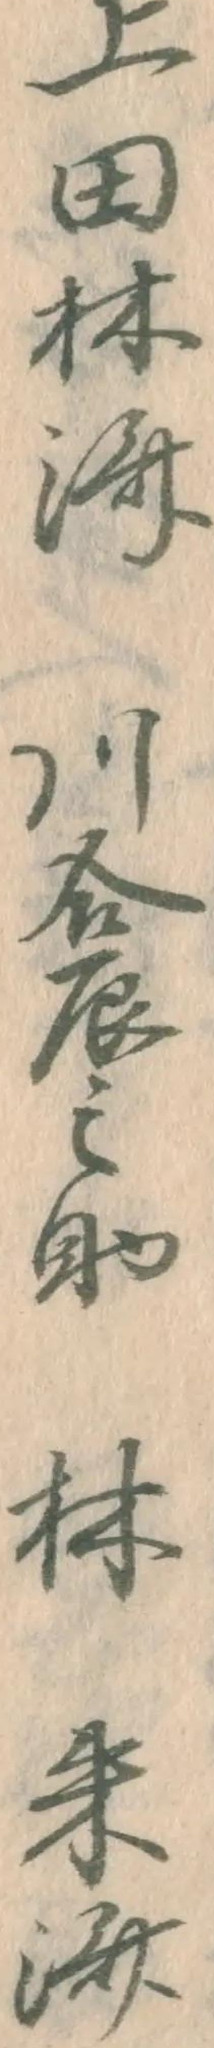上田林済川合辰之助林朱済

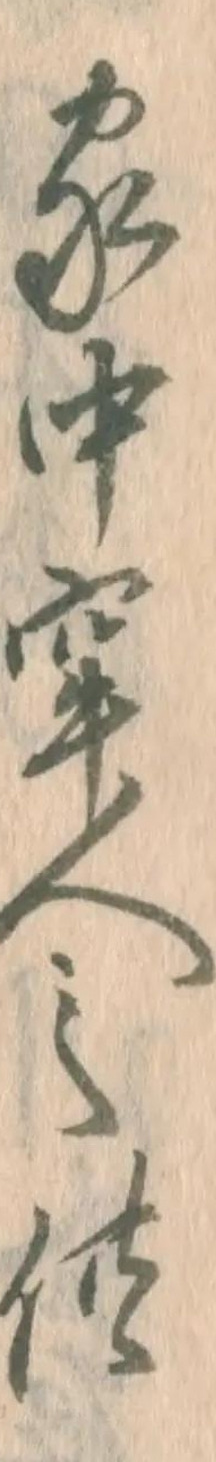家中牢人之供
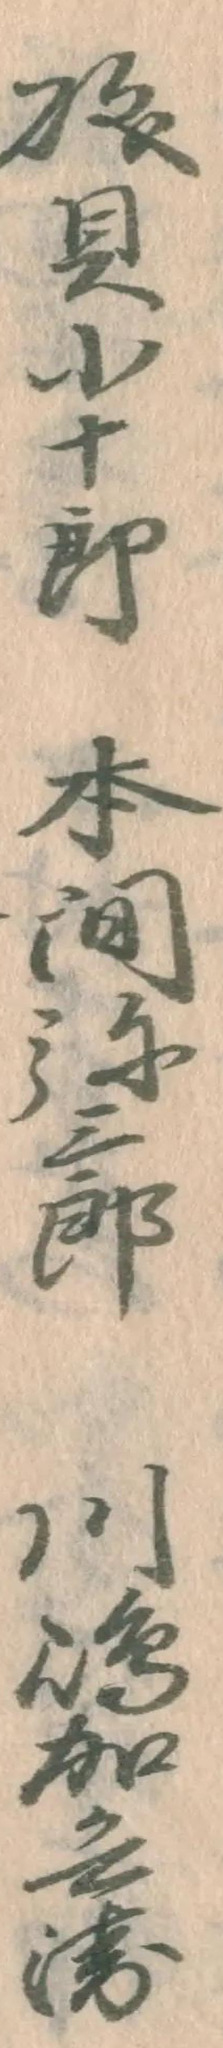磯貝小十郎本間弥三郎川島加兵衛
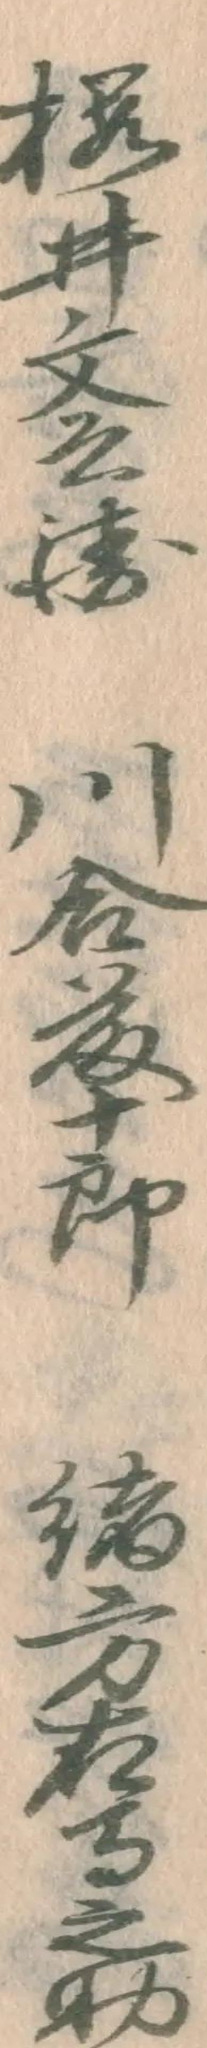桜井文兵衛川合藤十郎緒方右馬之助
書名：切支丹御退治記 49巻. [4]
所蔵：国立国会図書館 National Diet Library, JAPAN
